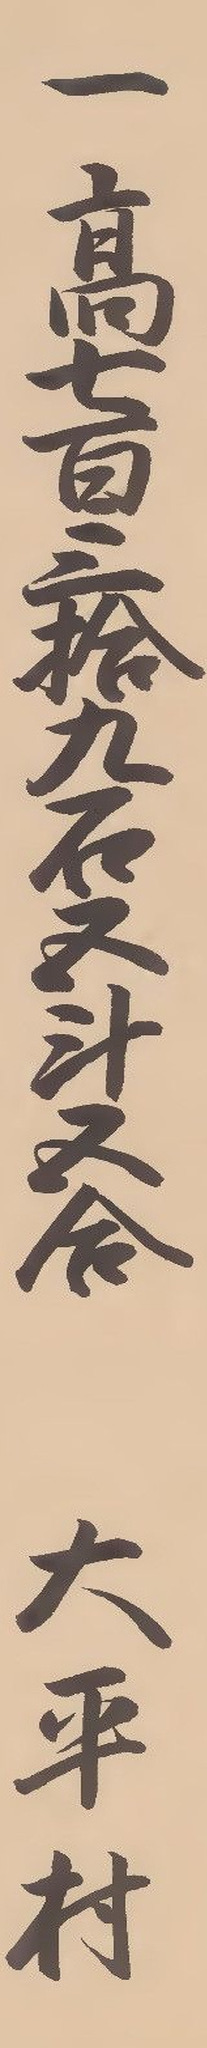一高七百三拾九石五斗五合大平村
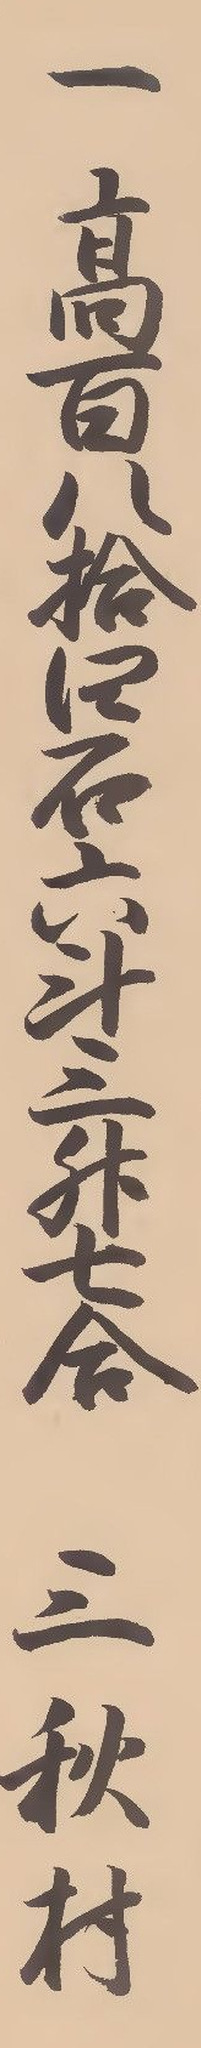一高百八拾四石六斗三升七合三秋村
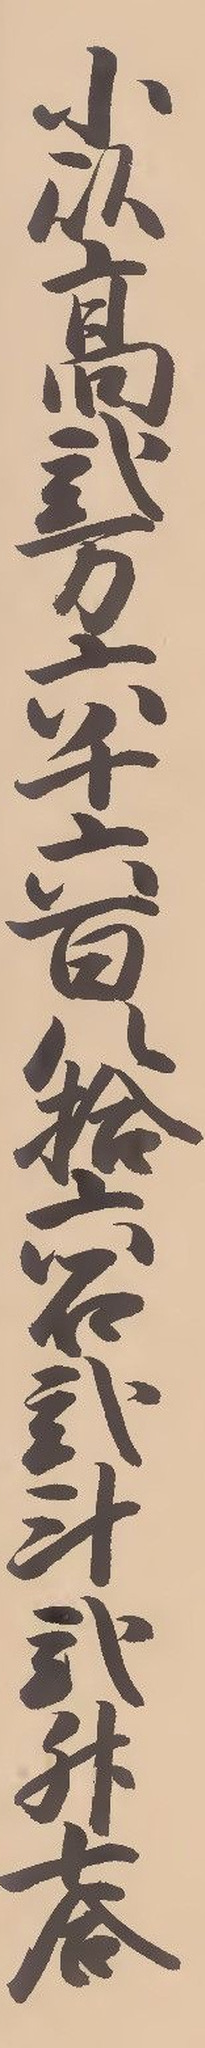小以高弐万六千六百八拾六石弐斗弐升七合

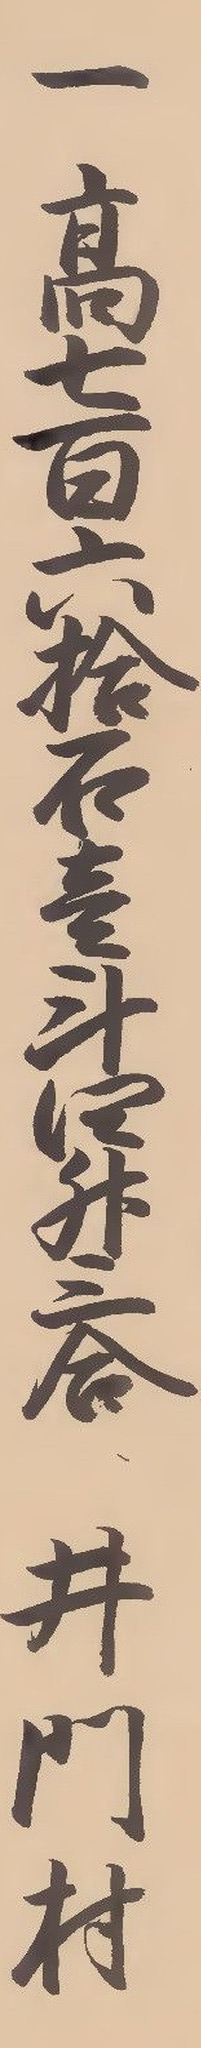一高七百六拾石壱斗四升三合井門村
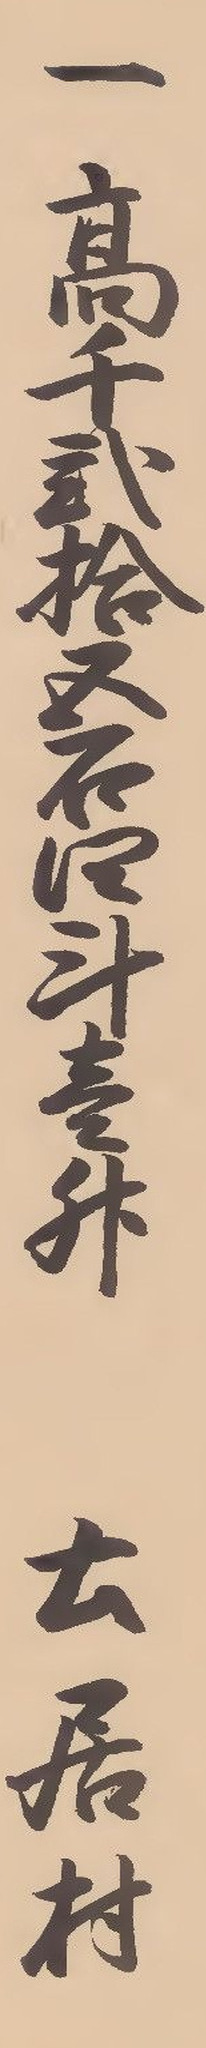一高千弐拾五石四斗壱升土居村
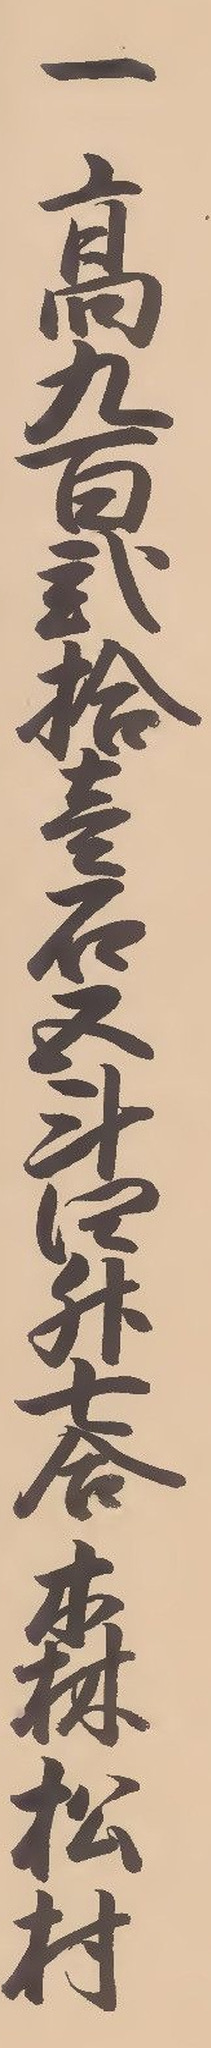一高九百弐拾壱石五斗四升七合森松村
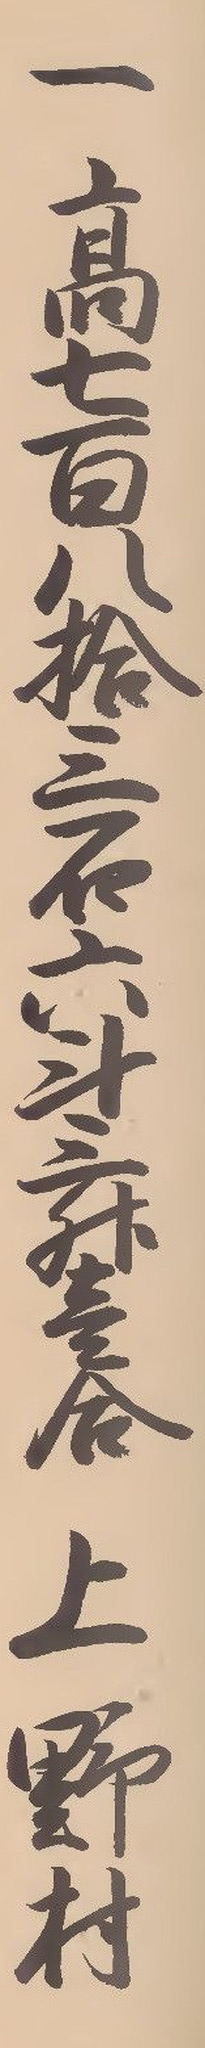一高七百八拾三石六斗三升壱合上野村
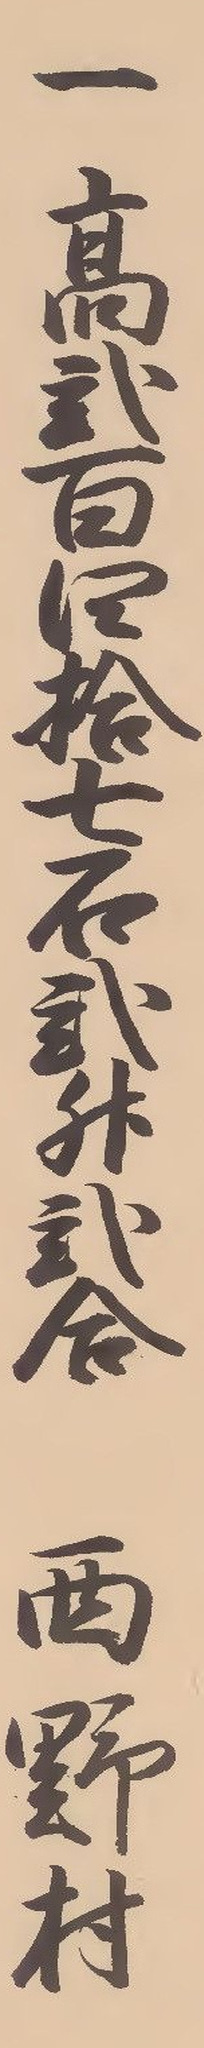一高弐百四拾七石弐升弐合西野村
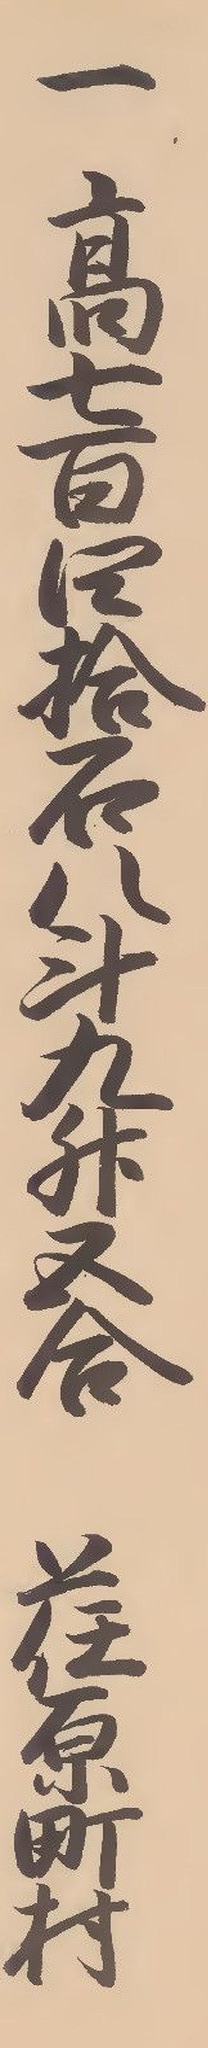一高七百四拾石八斗九升五合荏原町村
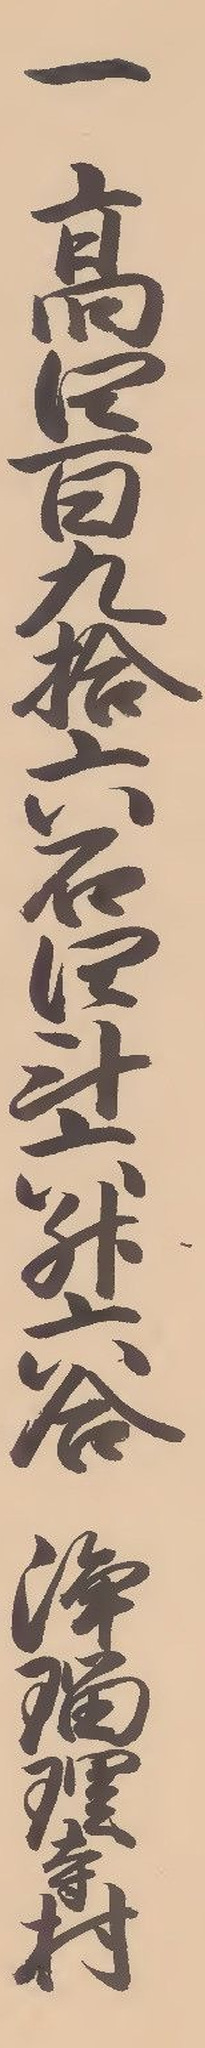一高四百九拾六石四斗六升六合浄瑠理寺村

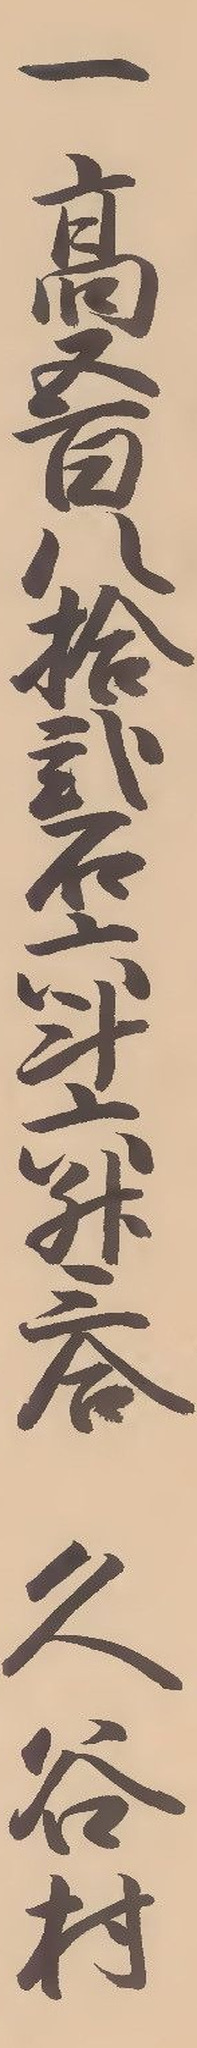一高五百八拾弐石六斗六升三合久谷村
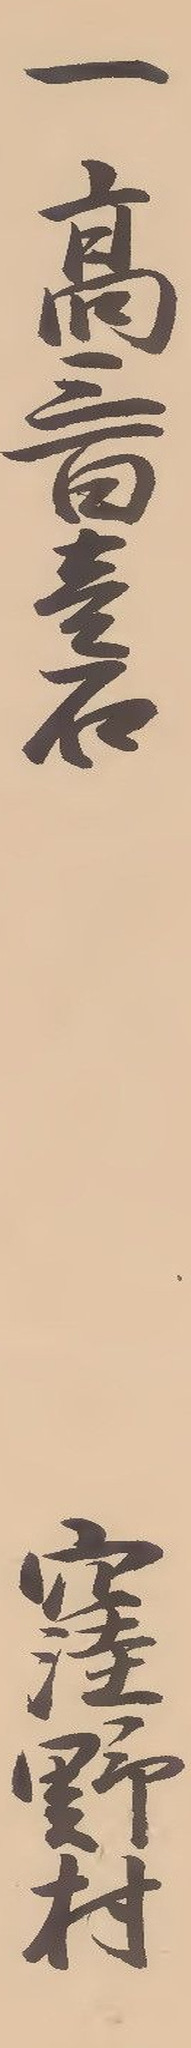一高三百壱石窪野村
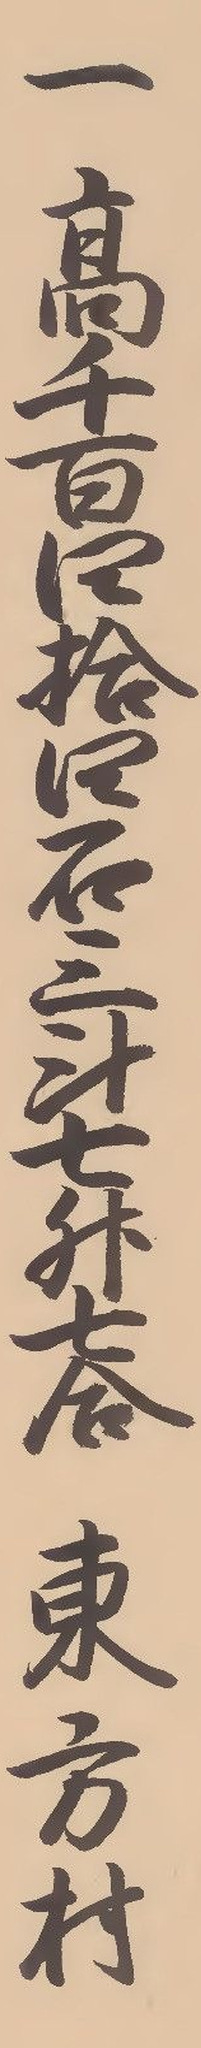一高千百四拾四石三斗七升七合東方村
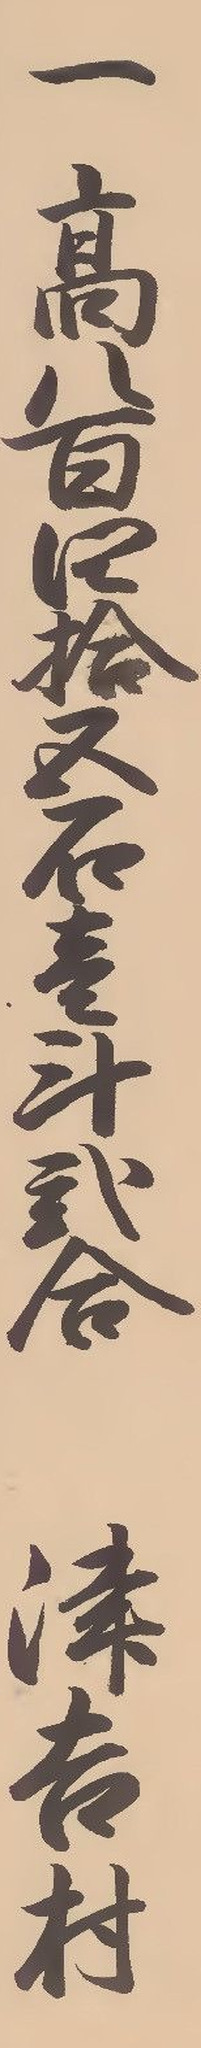一高八百四拾五石壱斗弐合津吉村
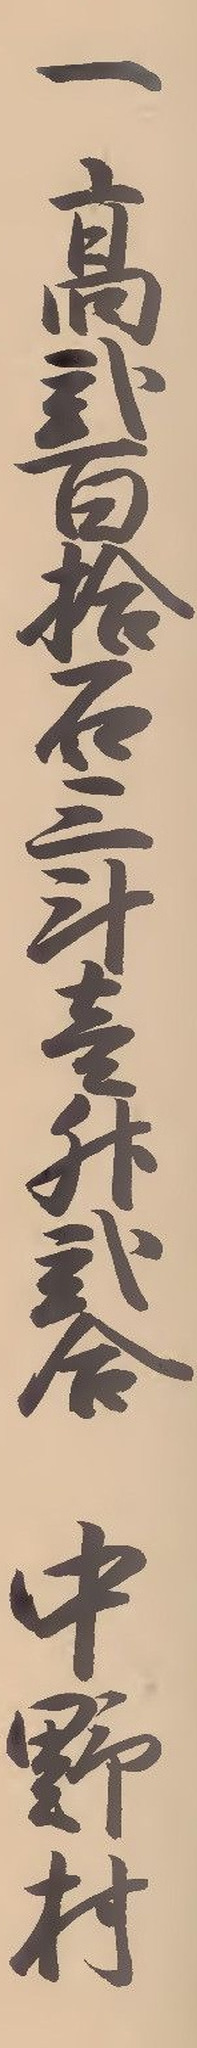一高弐百拾石三斗壱升弐合中野村
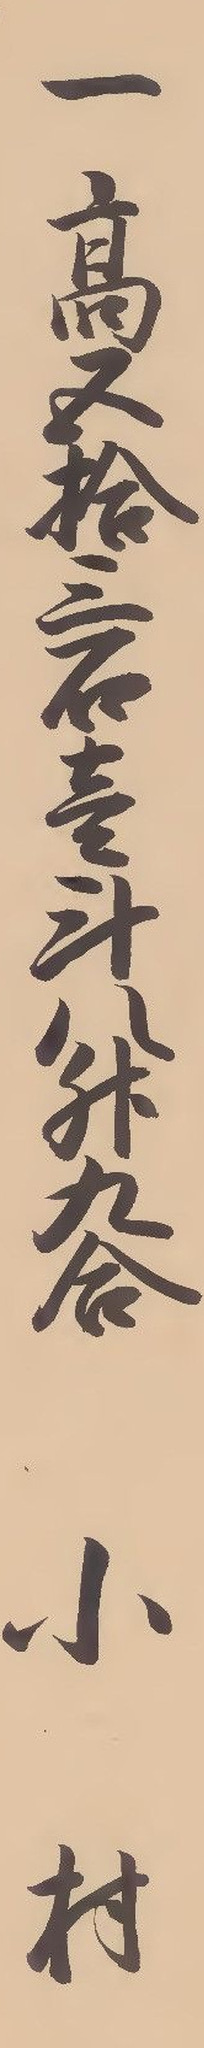一高五拾三石壱斗八升九合小村
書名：伊予国郷帳
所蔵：国立公文書館 National Archives of Japan
